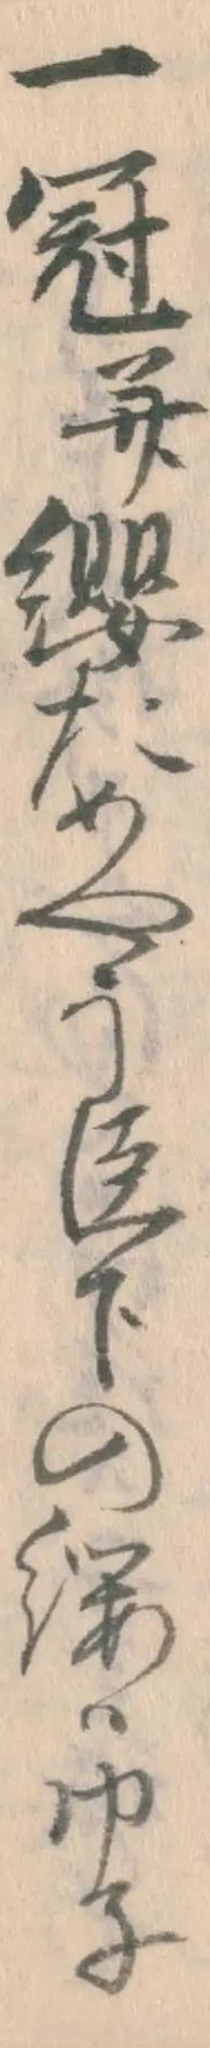一冠并纓ためやう臣下の纓ハ巾子
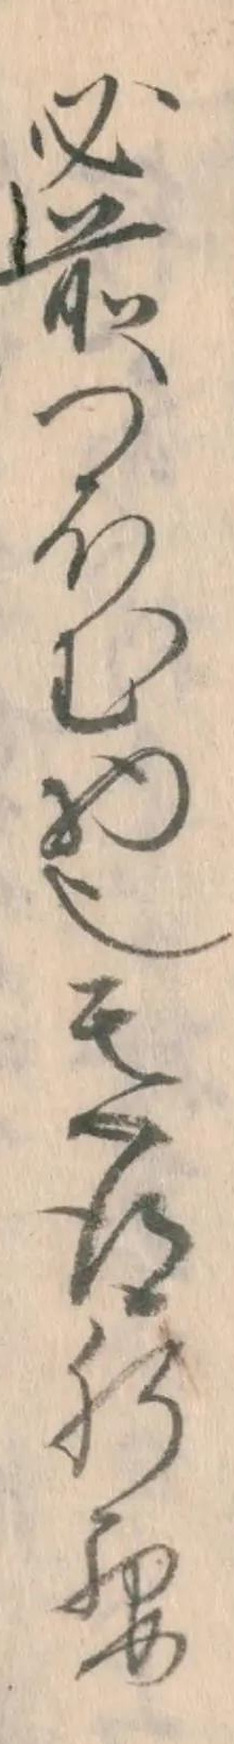必前へつほむ物也其心得肝要
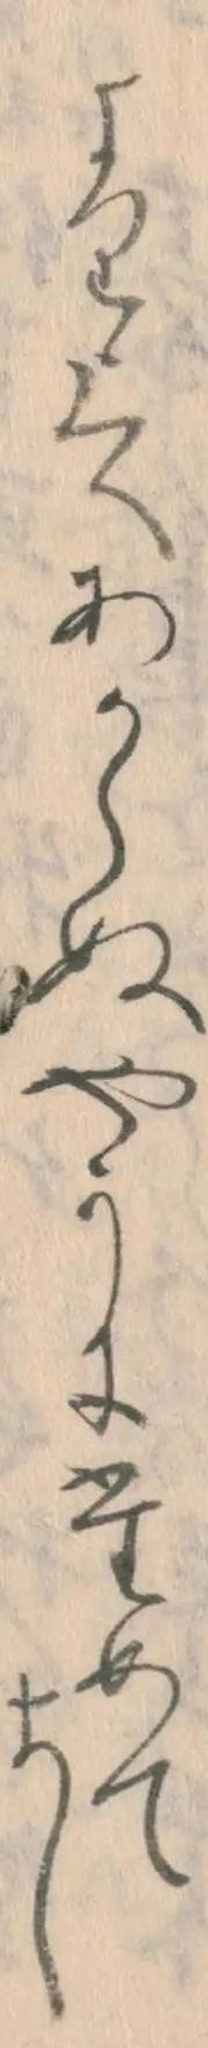より上へあからぬやうにためてよし
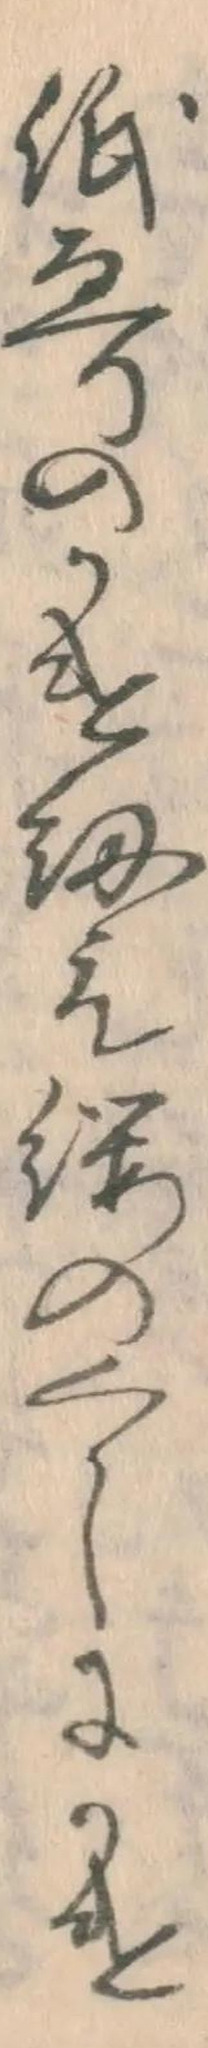紙ゑりのかけ緒ニて纓のくしにかけ
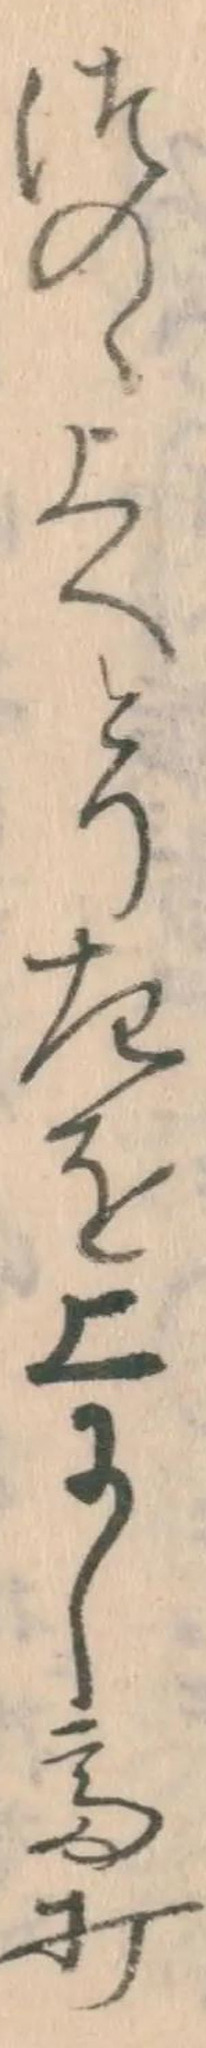つのゝ上へとり左を上にして打
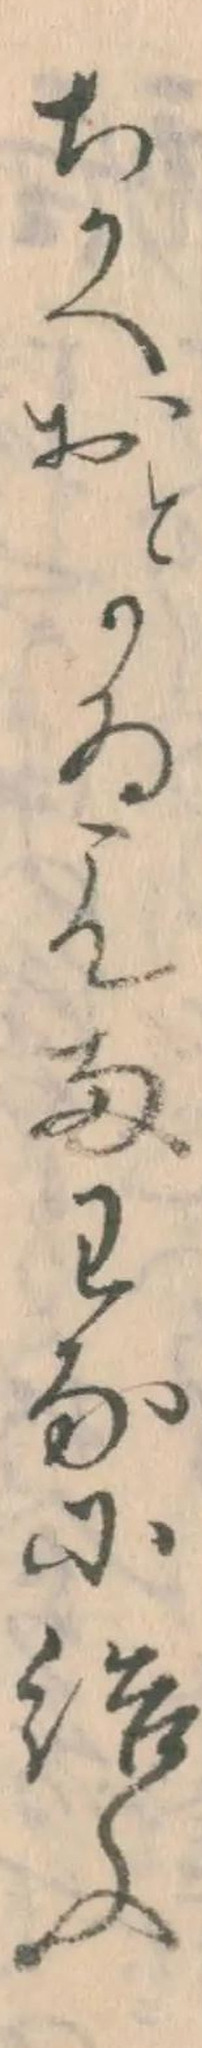ちかへおとかゐニて両わなに結ふ
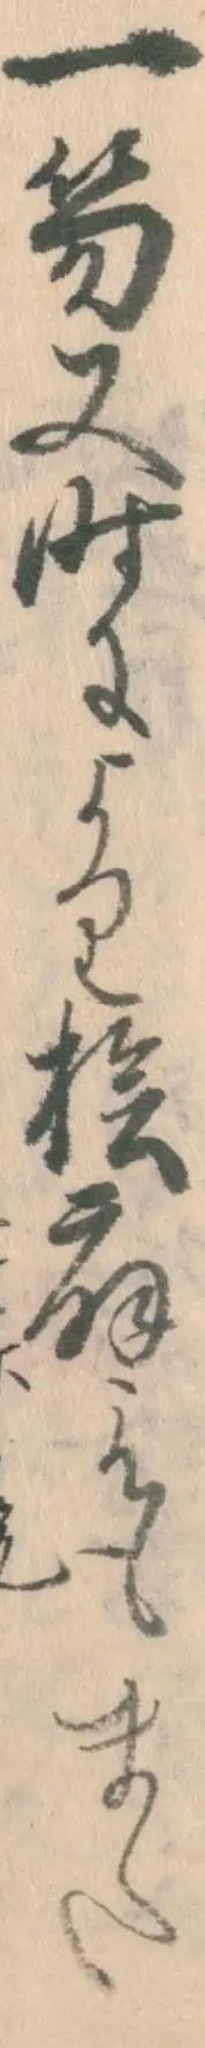一笏又時により桧扇ニてもまた
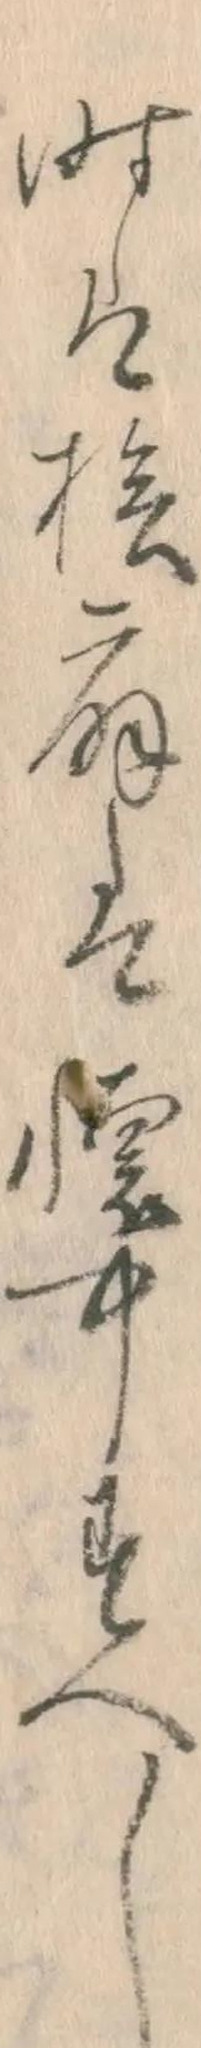時は桧扇は懐中すへし
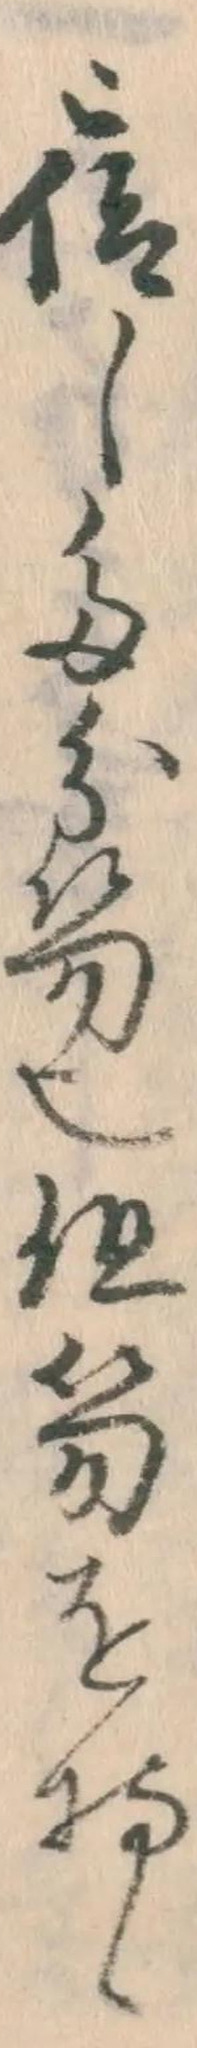被仰し多分笏也但笏を持候
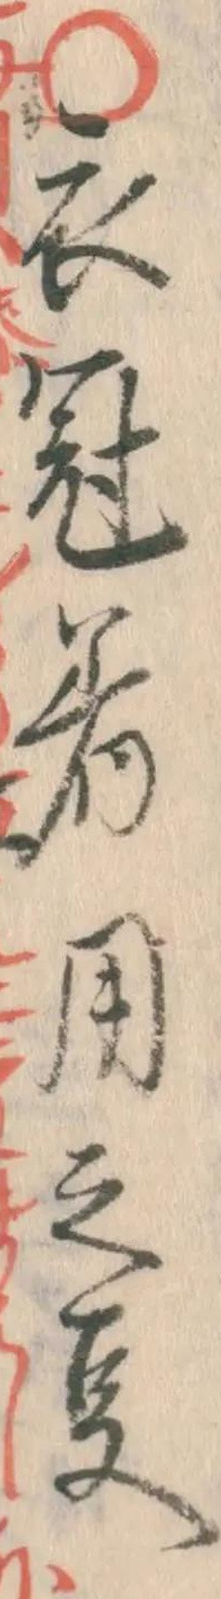〇衣冠着用之事
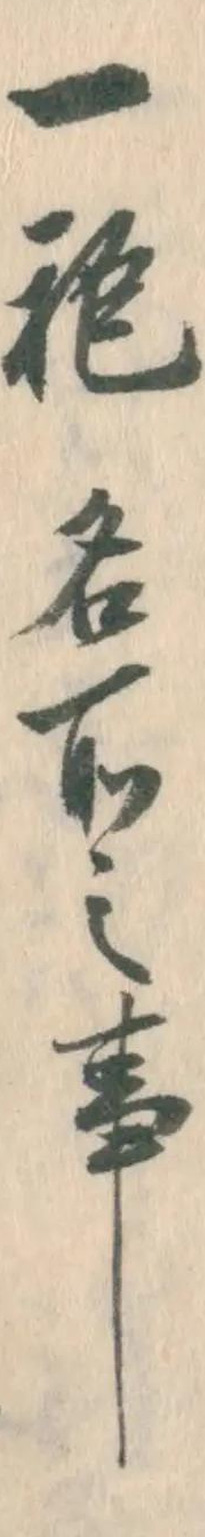一袍名前之事
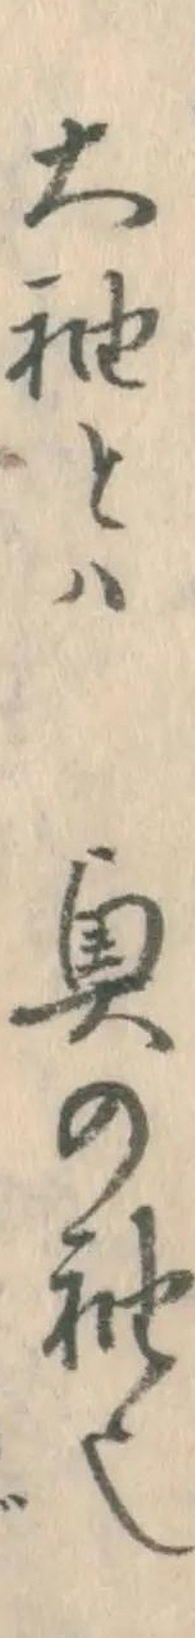大袖とハ奥の袖也

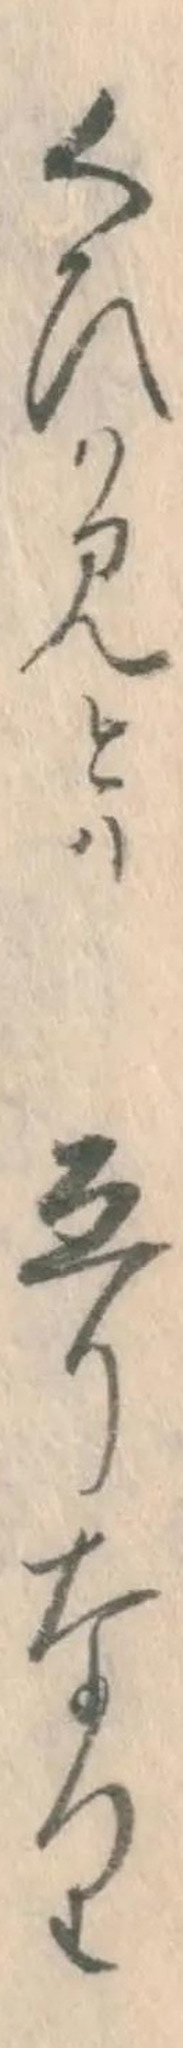くびかみとハゑりなり
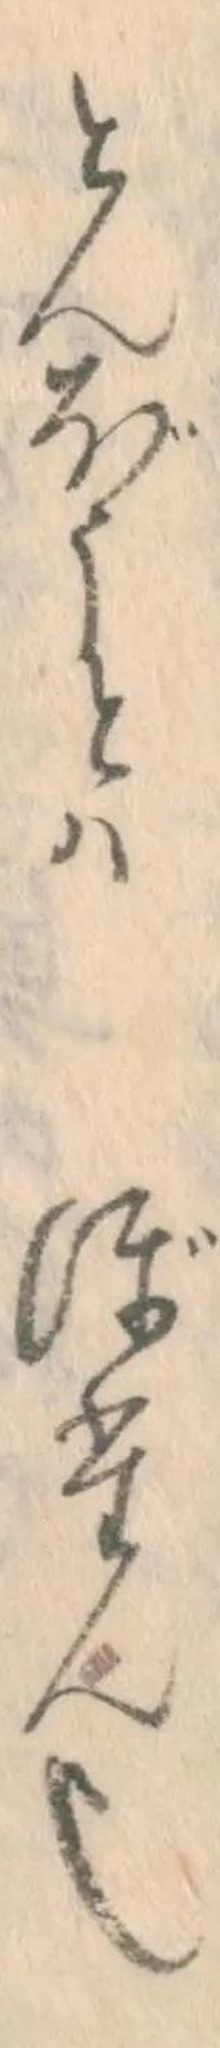とんぼうとハぼたん也
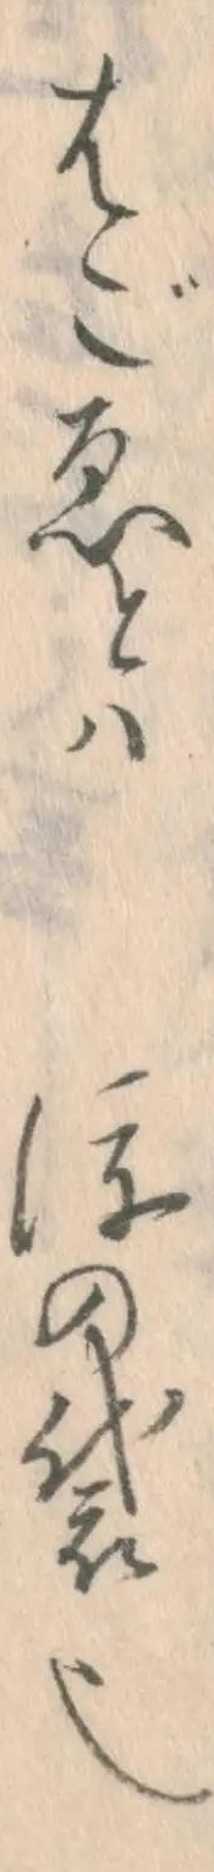はごゑとハ後の袋也
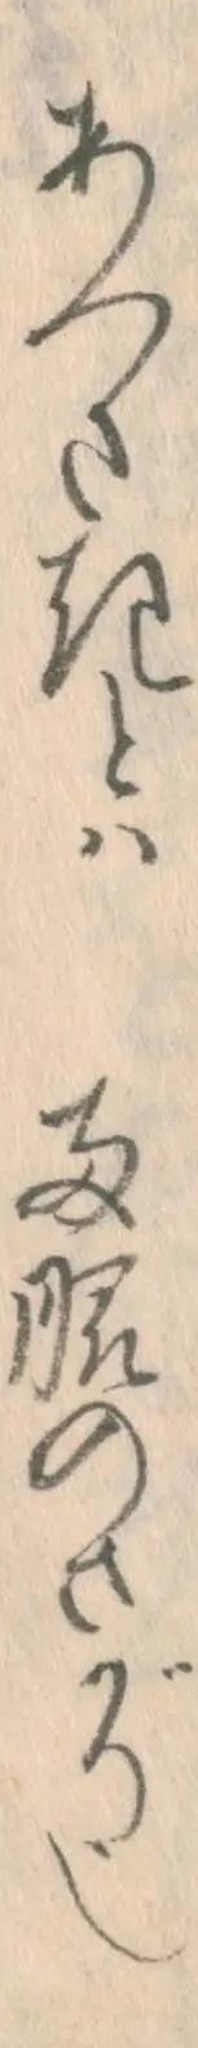あつたきとハ両脇のさがり也
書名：賀茂社記録. 第80冊
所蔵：国立国会図書館 National Diet Library, JAPAN
